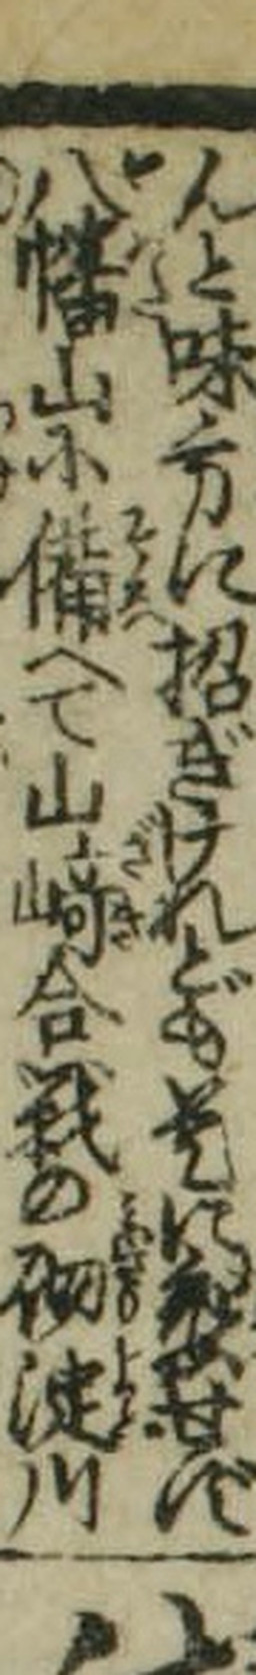八幡山に備へて山崎合戦の砌淀川
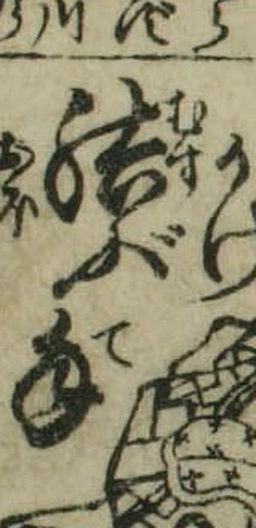結ぶ手
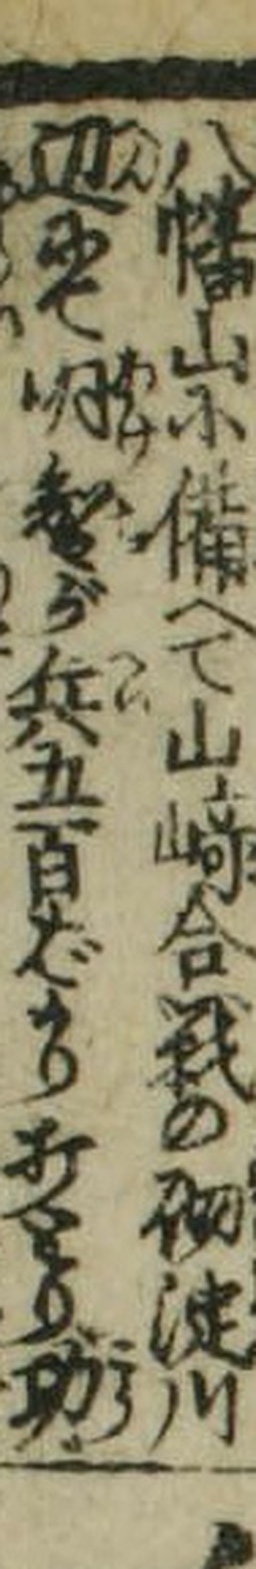辺にて明智が兵五百ばかり打とり功
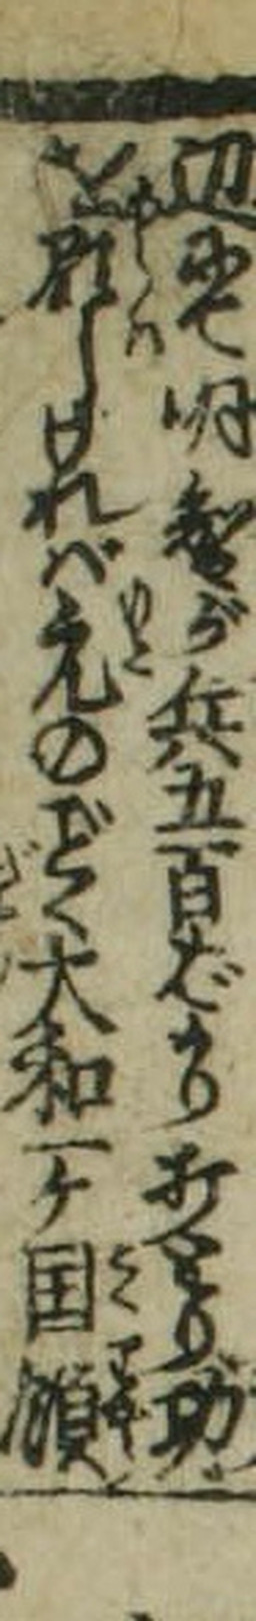を顕しければ元のごとく大和一ヶ国領
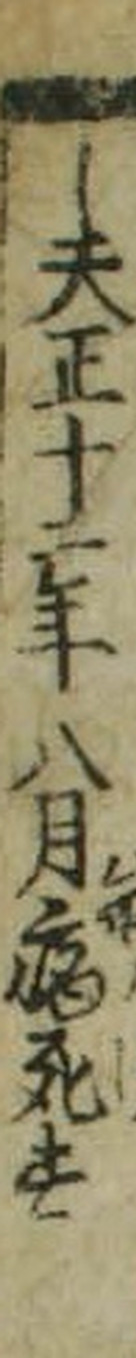し天正十二年八月病死す
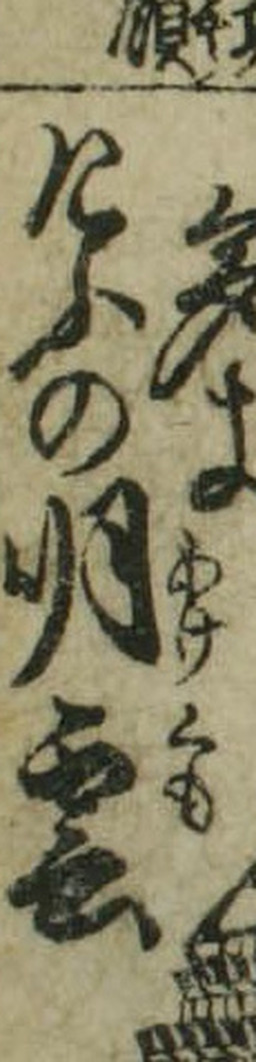けふの明雲

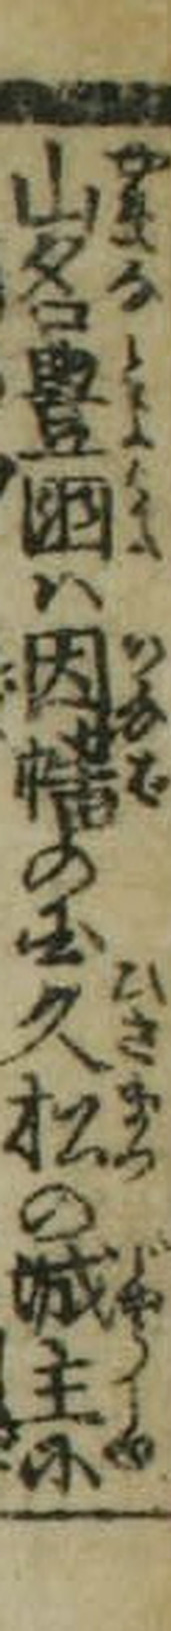山名豊国は因幡の出久松の城主に
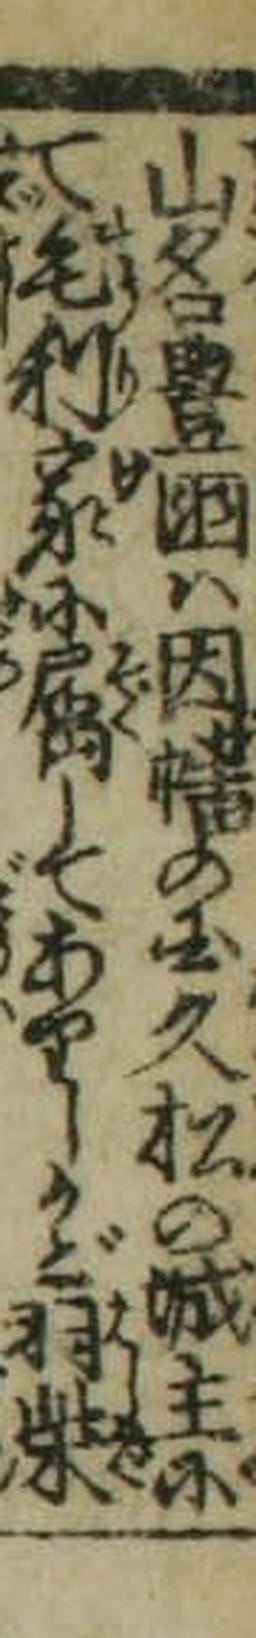て毛利家に属してありしかど羽柴
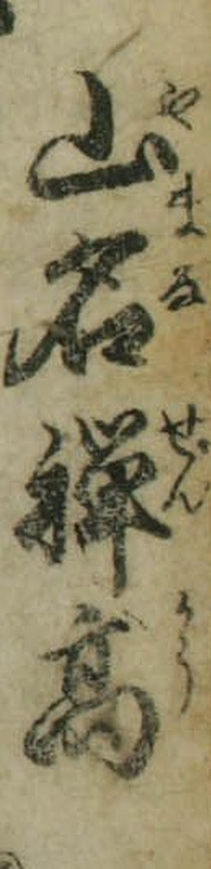山名禅高
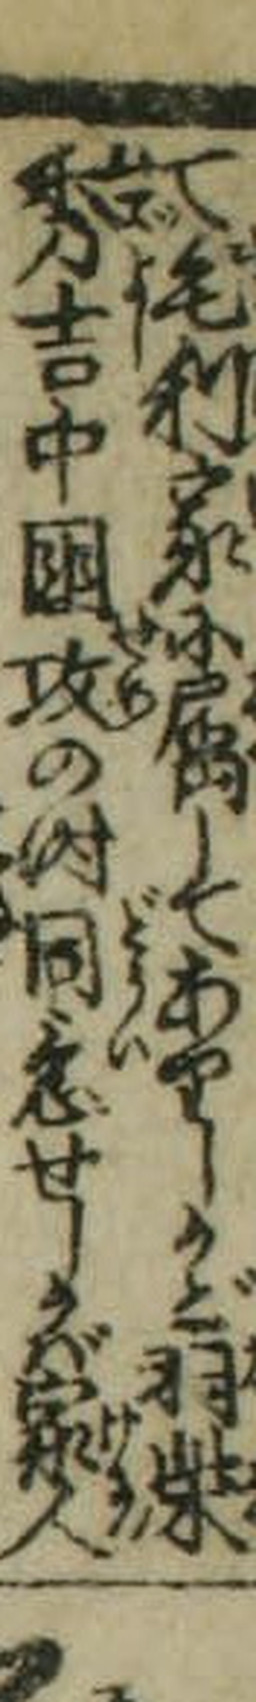秀吉中国攻の時同意せしかば家人
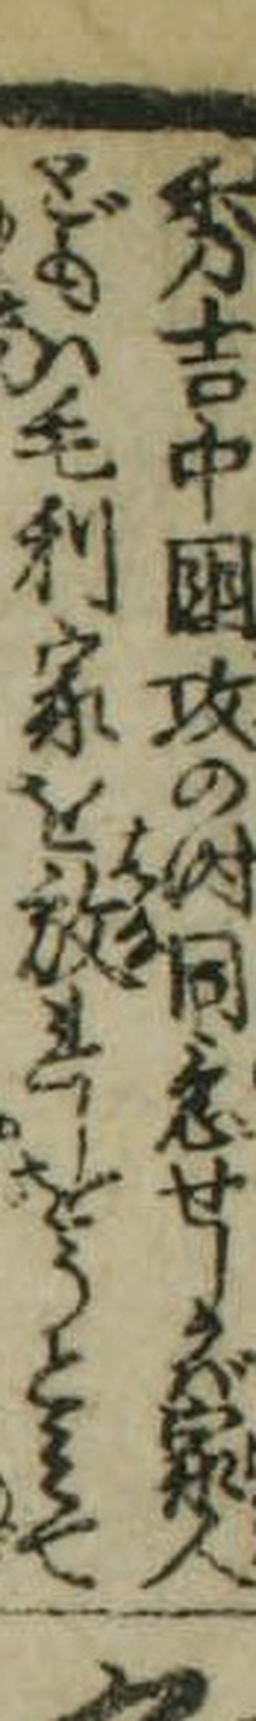どもは毛利家を放れしをうとみて
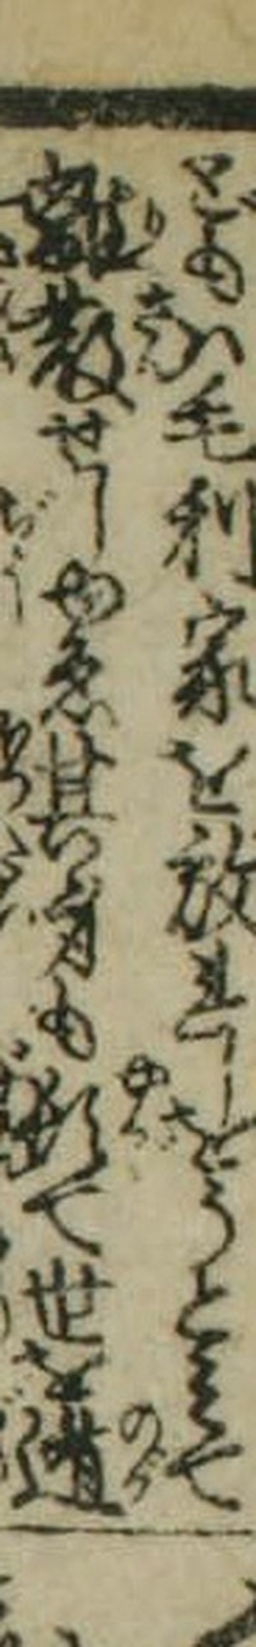離散せしゆゑ其身も頓て世を遁
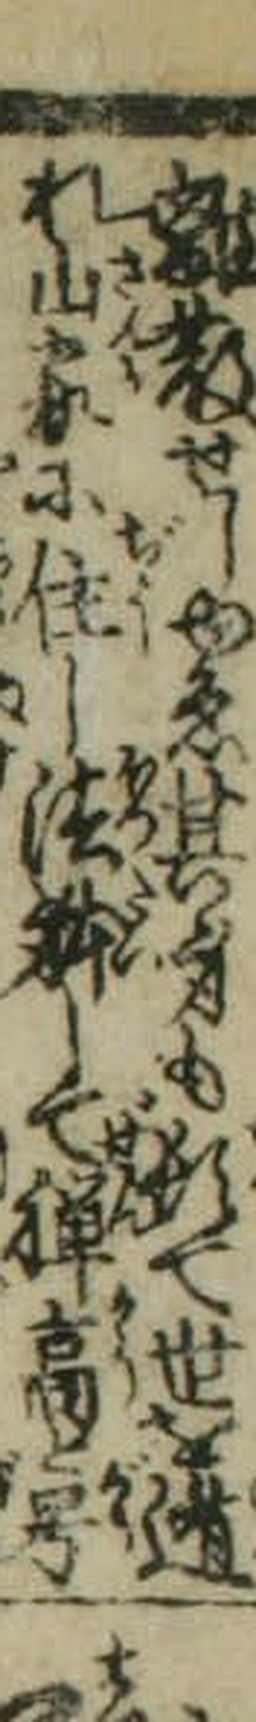れ山家に住し法躰して禅高と号
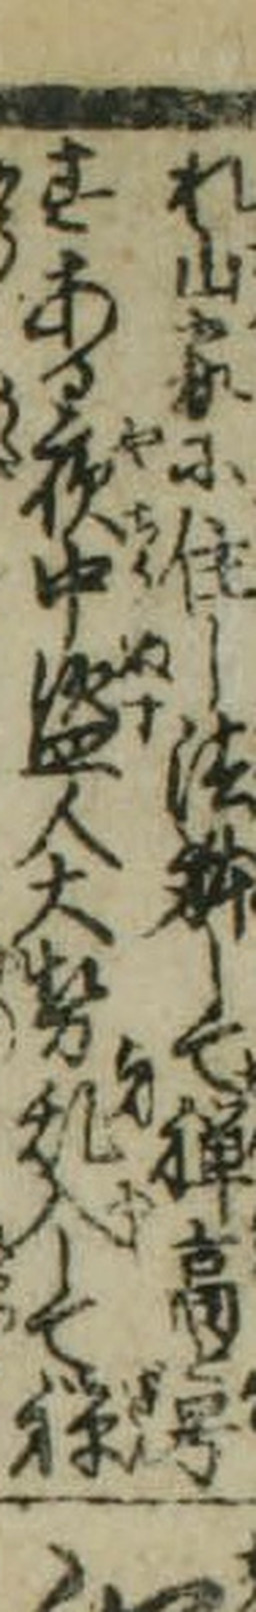すある夜中盗人大勢乱入して禅
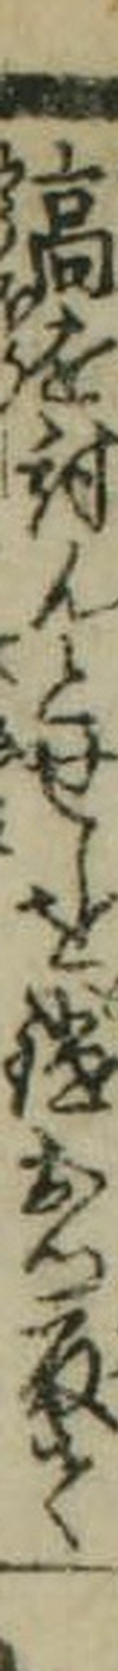高を討んとせしを鑓おつ取て
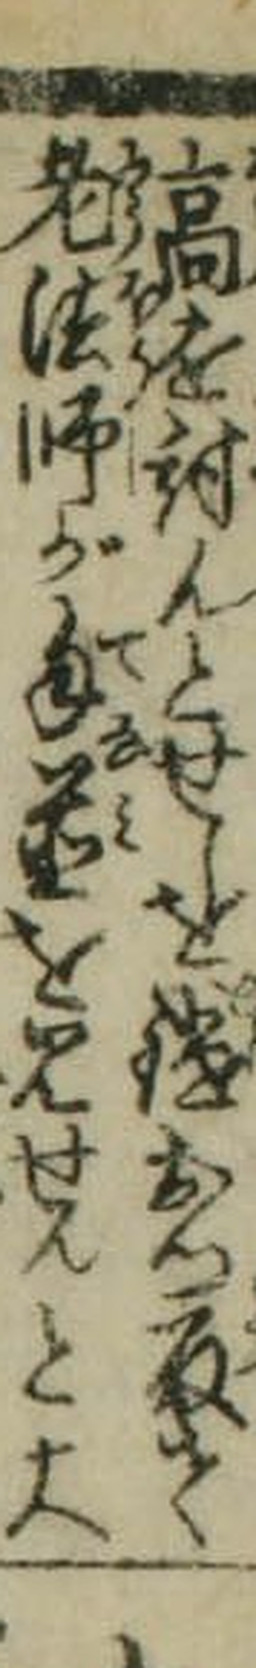老法師が手並を見せんと大
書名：續英雄百人一首
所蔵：東京学芸大学附属図書館
